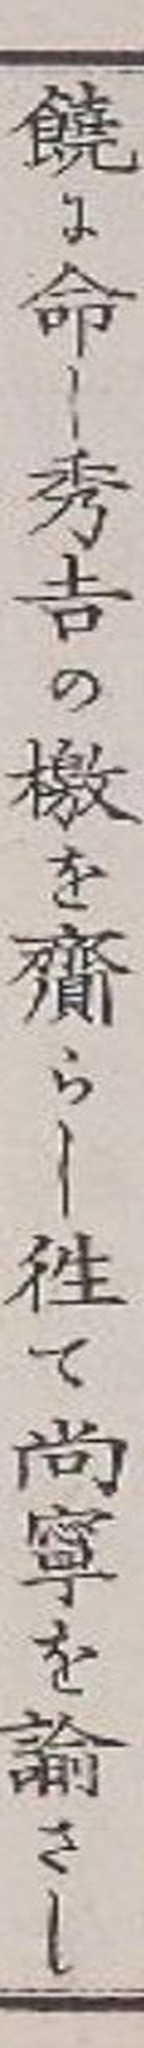饒に命し秀吉の檄を齎らし往て尚寧を諭さし
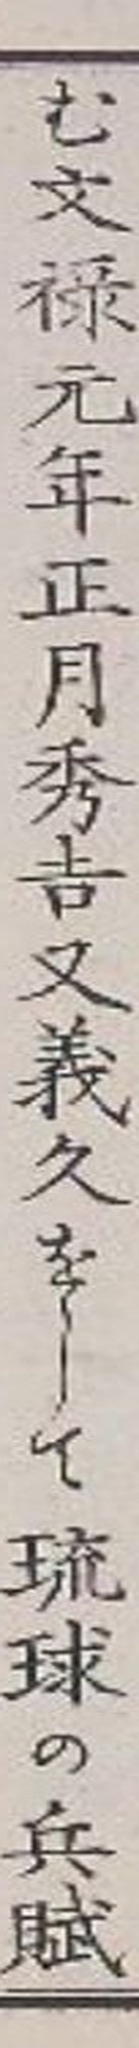む文禄元年正月秀吉又義久をして琉球の兵賦
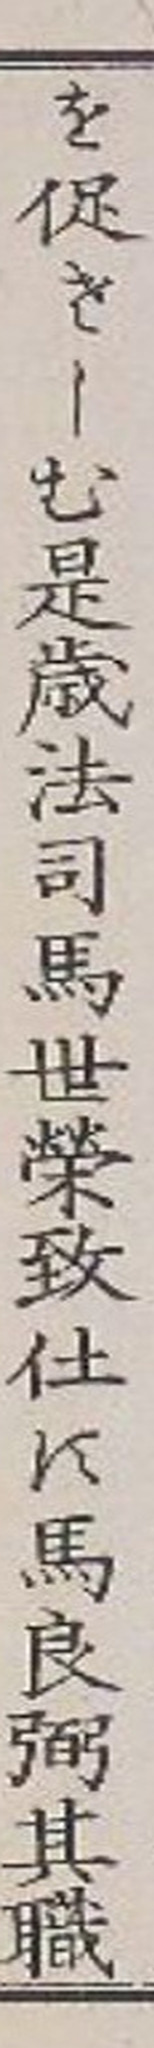を促せしむ是歳法司馬世栄致仕す馬良弼其職
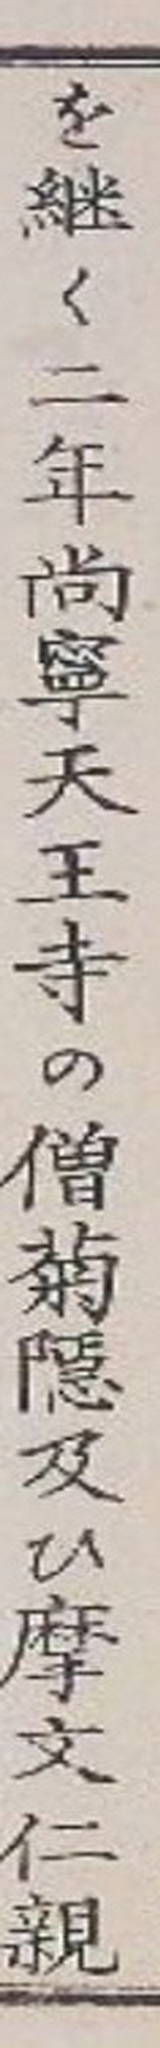を継く二年尚寧天王寺の僧菊隠及ひ摩文仁親
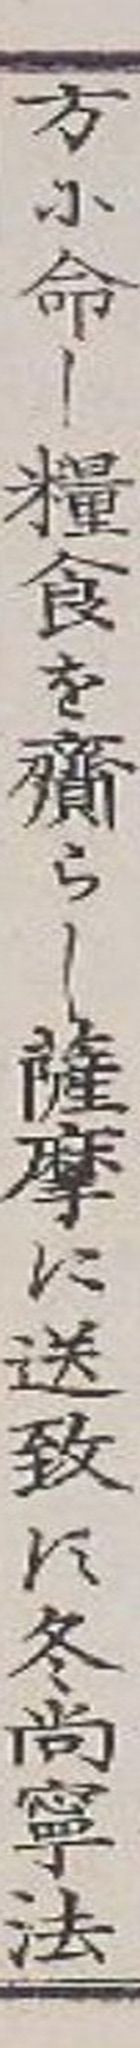方に命し糧食を齎らし薩摩に送致す冬尚寧法
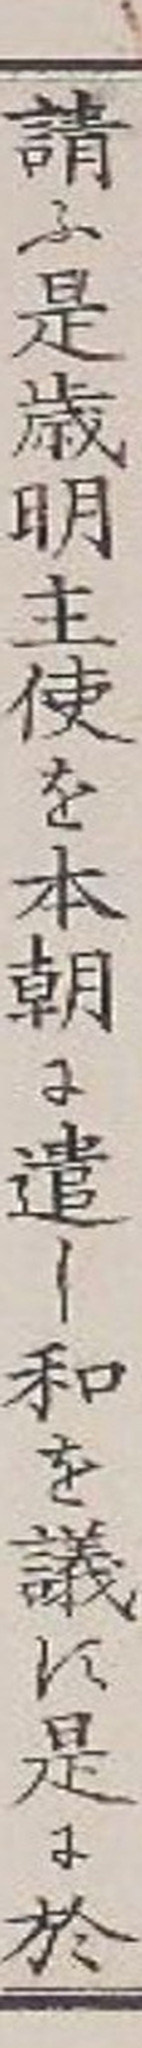請ふ是歳明主使を本朝に遣し和を議す是に於
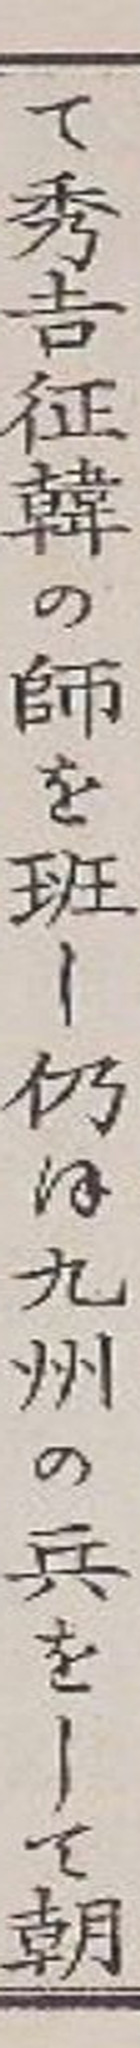て秀吉征韓の師を班し仍ほ九州の兵をして朝
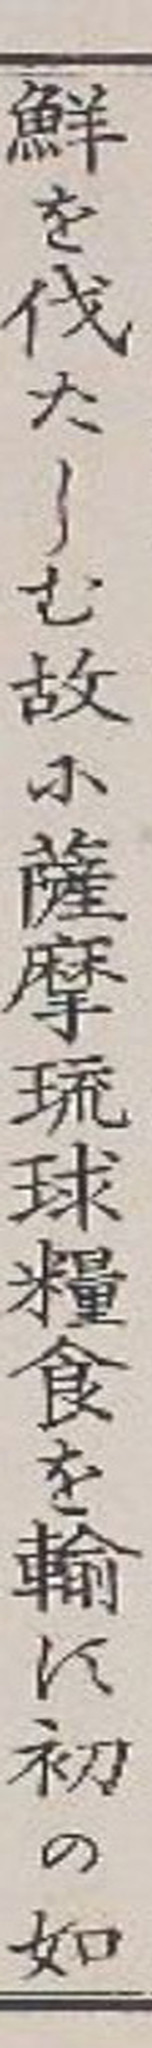鮮を伐たしむ故に薩摩琉球糧食を輸す初の如
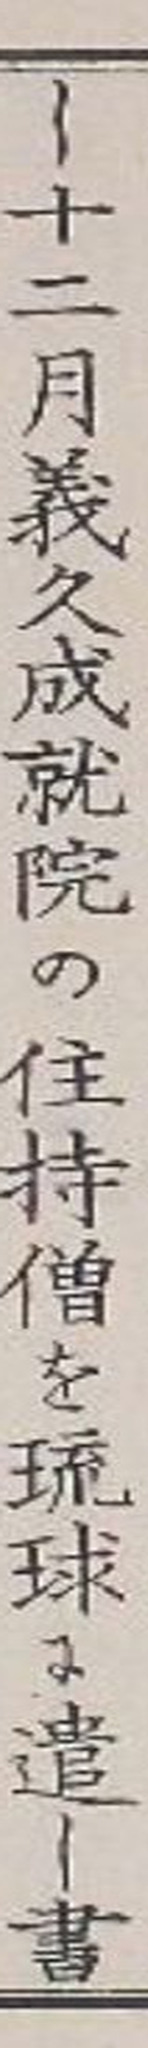し十二月義久成就院の住持僧を琉球に遣し書
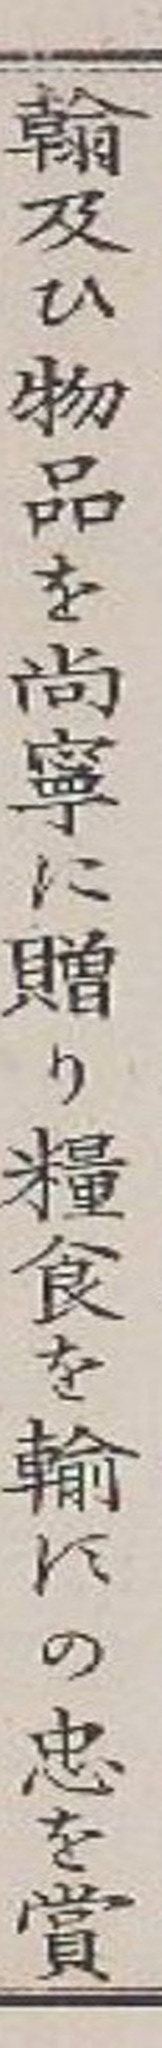翰及ひ物品を尚寧に贈り糧食を輸すの忠を賞
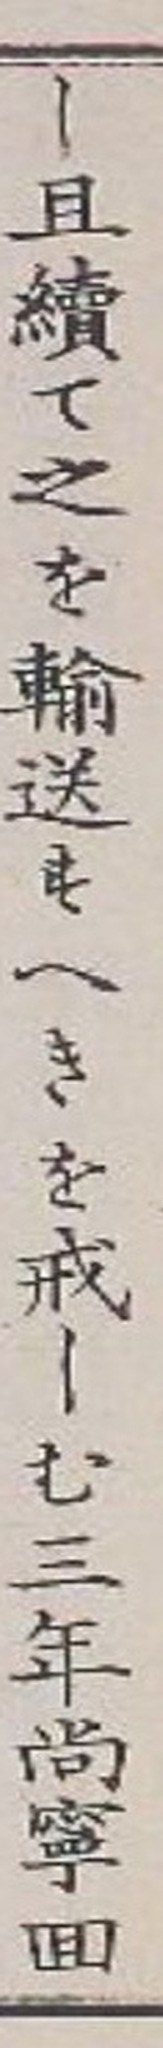し且続て之を輸送すへきを戒しむ三年尚寧回
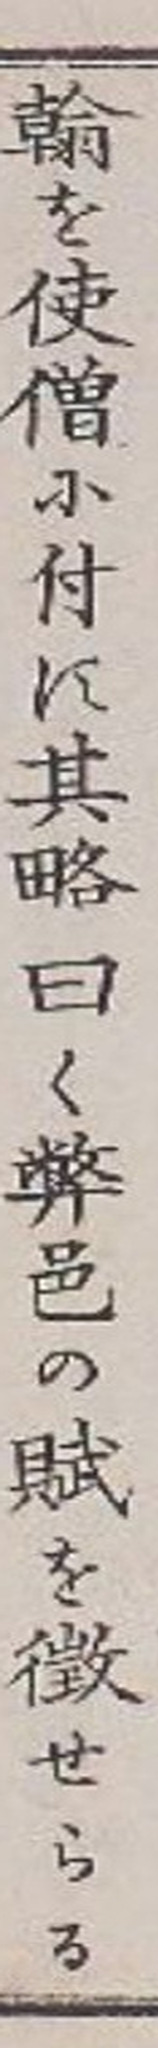翰を使僧に付す其略曰く弊邑の賦を徴せらる
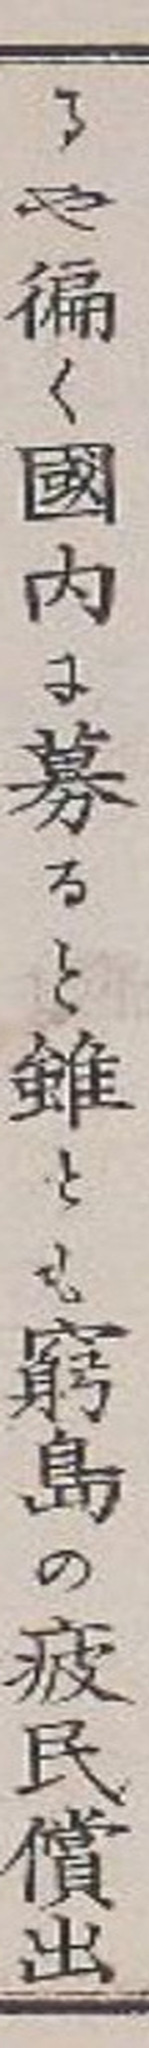るや遍く国内に募ると雖とも窮島の疲民償出
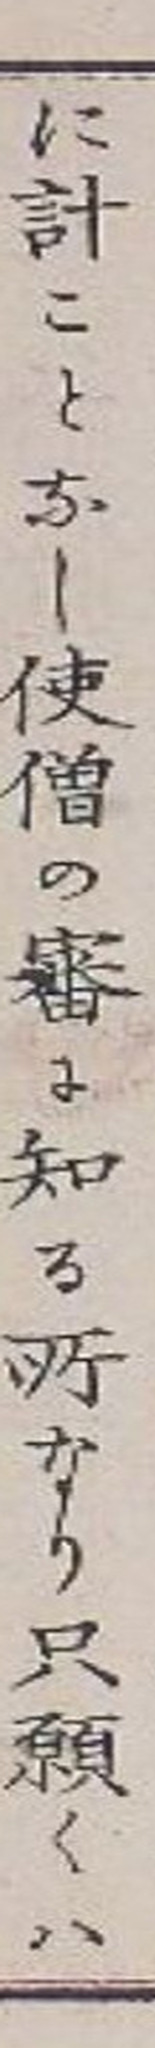に計ことなし使僧の審に知る所なり只願くは

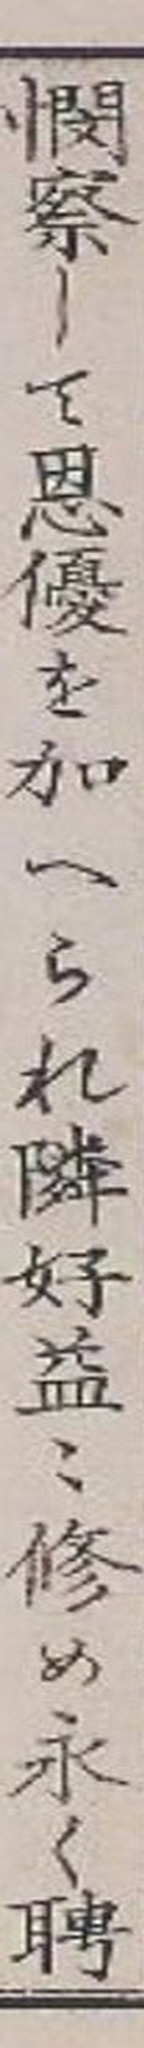憫察して思優を加へられ隣好益々修め永く聘
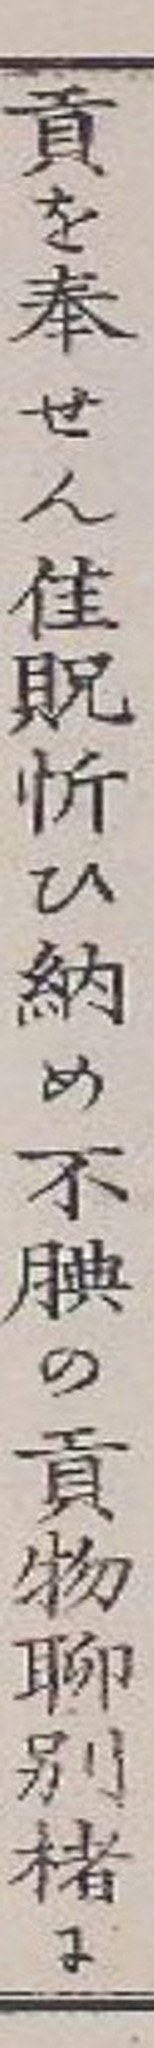貢を奉せん佳貺忻ひ納め不腆の貢物聊別楮に
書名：南島紀事 中
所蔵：University of the Ryukyus Library
